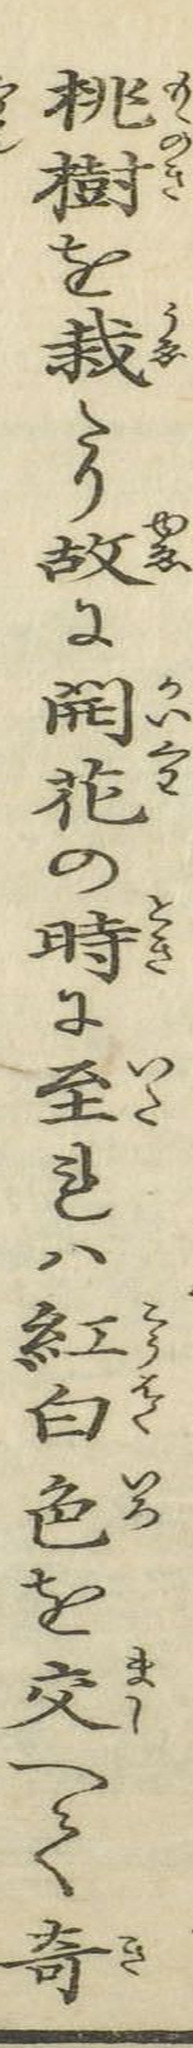桃樹を栽たり故に開花の時に至れは紅白色を交へて奇
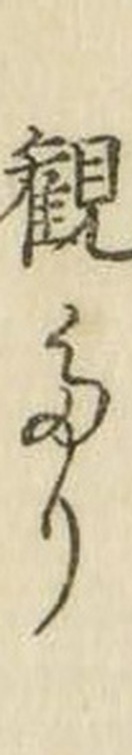観たり
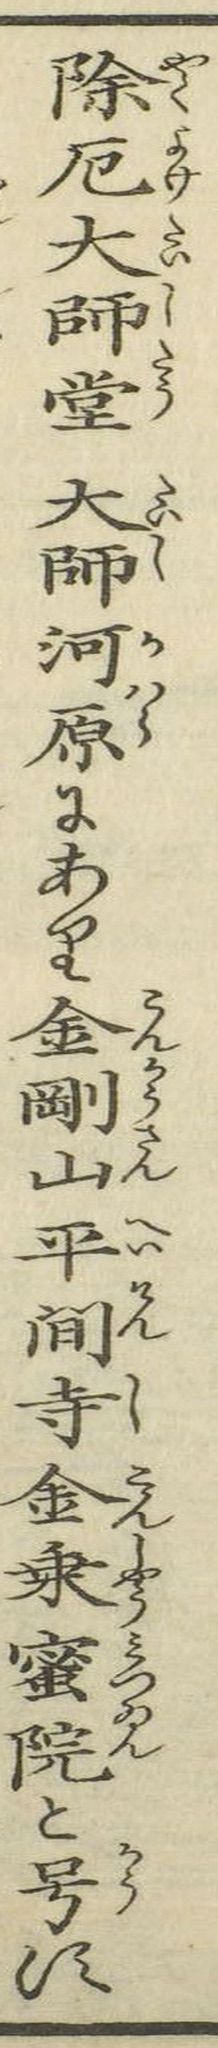除厄大師堂大師河原にあり金剛山平間寺金乗蜜院と号す

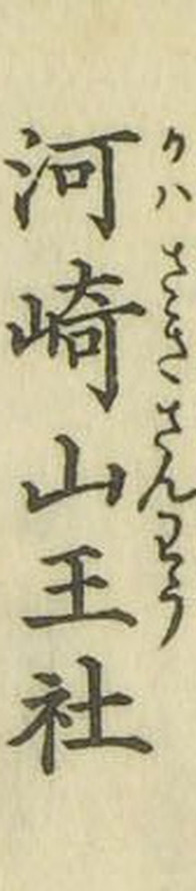河崎山王社

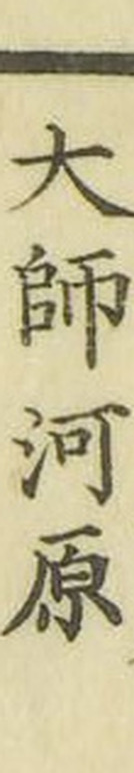大師河原
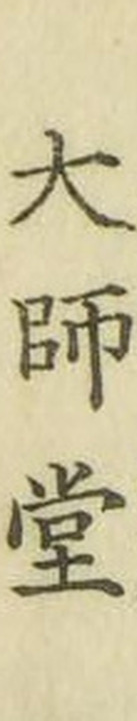大師堂
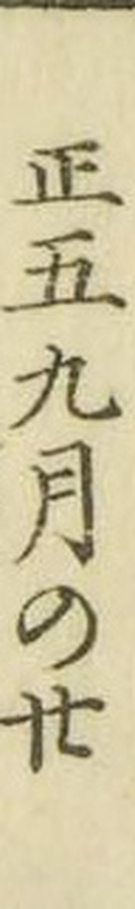正五九月の廿
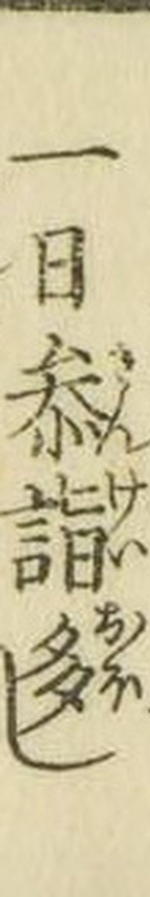一日参詣多し
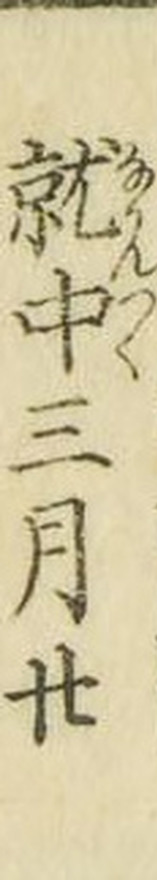就中三月廿
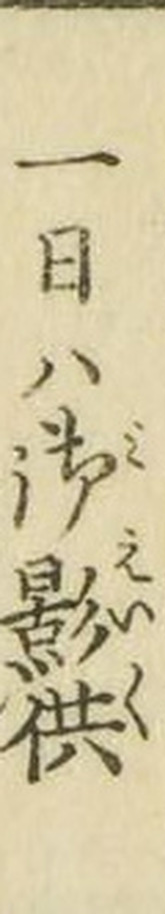一日は御影供
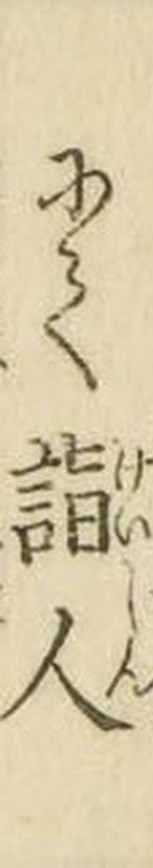にて詣人
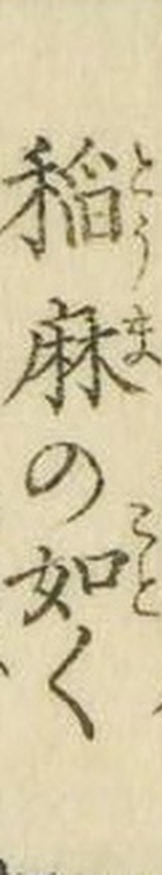稲麻の如く
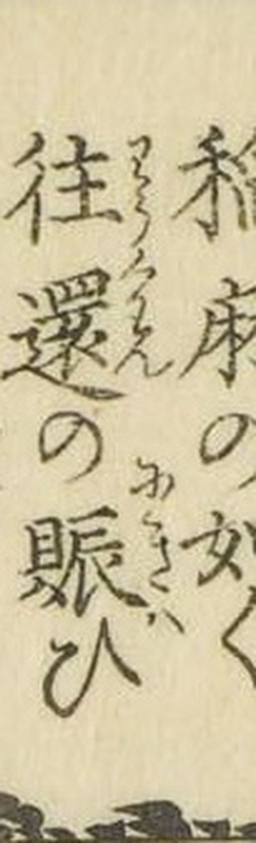往還の賑ひ

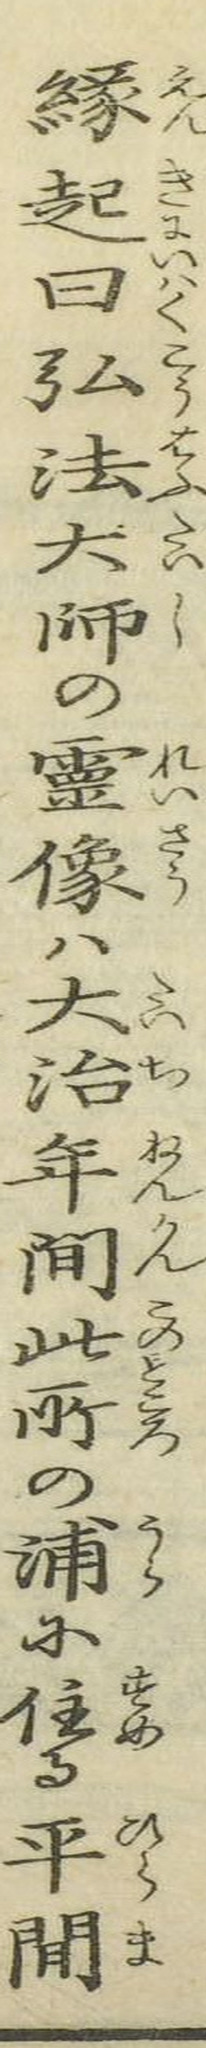縁起曰弘法大師の霊像は大治年間此所の浦に住る平間
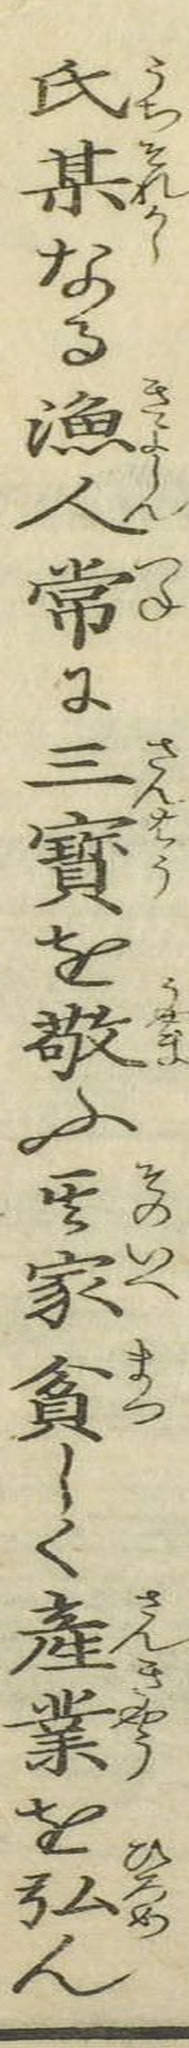氏某なる漁人常に三寳を敬ふ其家貧しく産業を弘ん
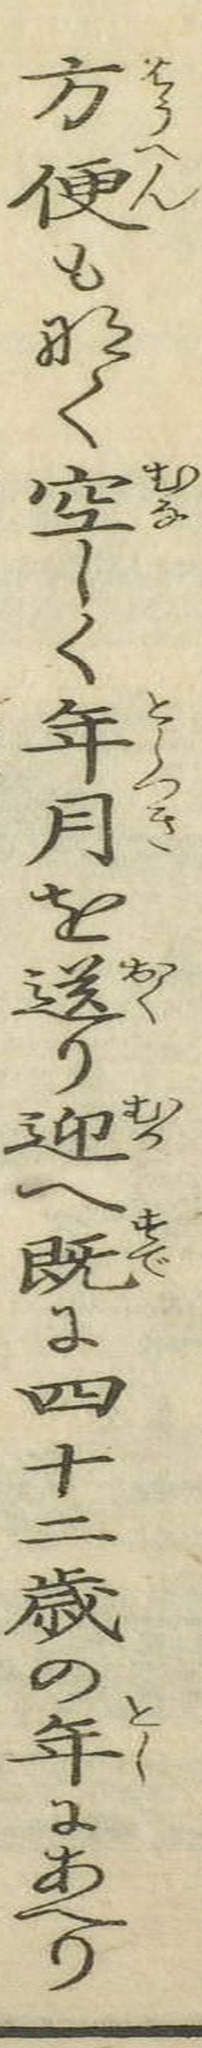方便もなく空しく年月を送り迎へ既に四十二歳の年にあへり
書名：江戸名所図会 20巻 巻之5
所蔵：東京学芸大学教育コンテンツアーカイブ
